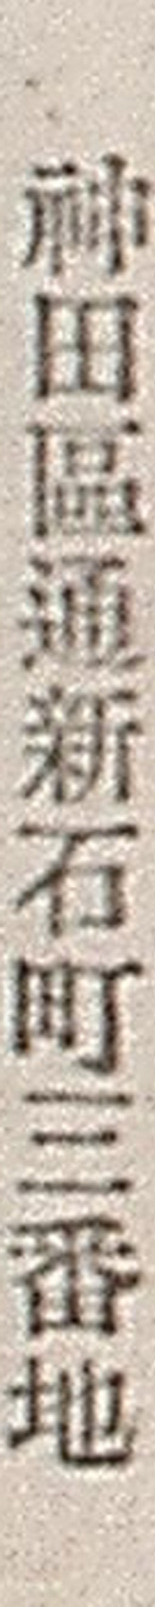神田区通新石町三番地

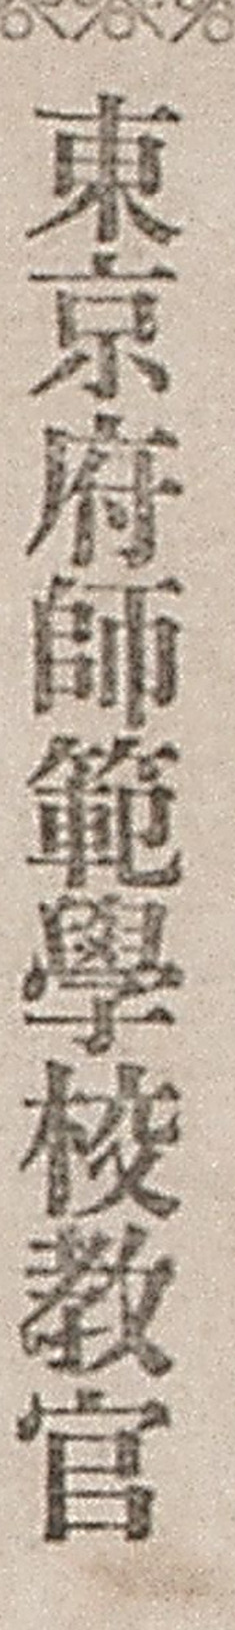東京府師範学校教官
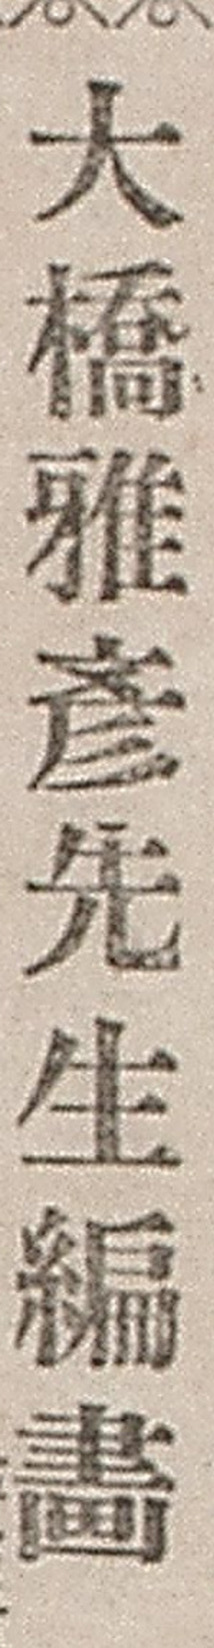大橋雅彦先生編畫
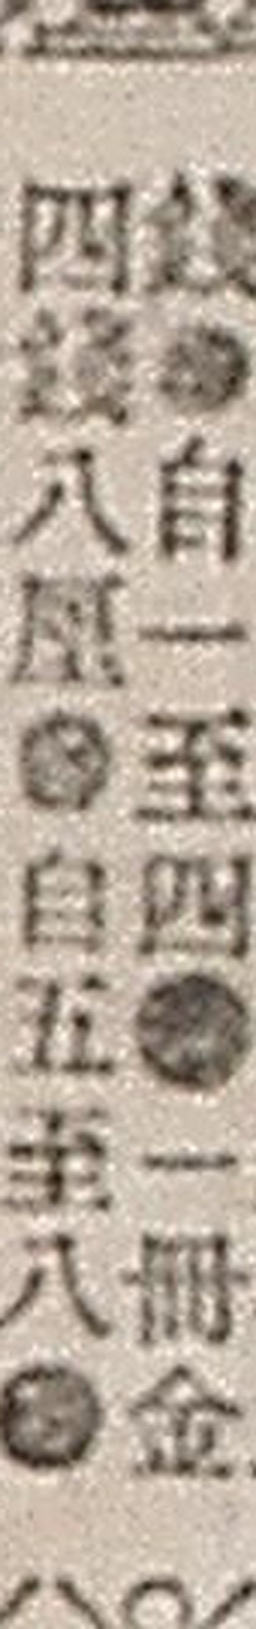四銭八厘●自五至八●
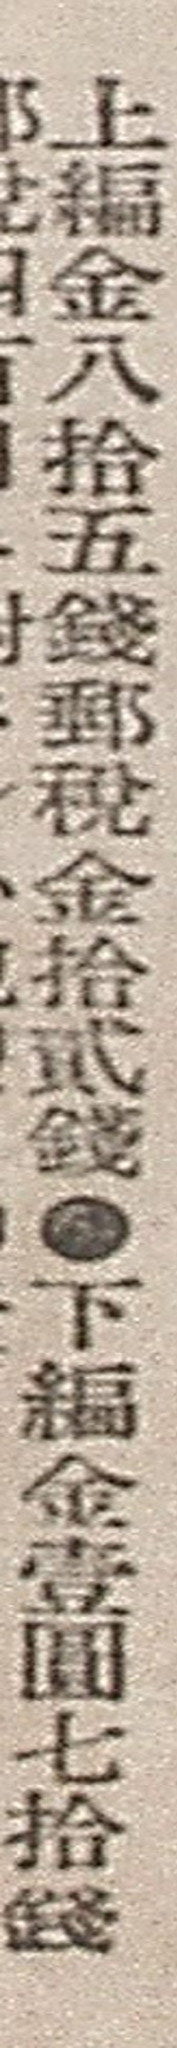上編金八拾五銭郵税金拾弐銭●下編金壱圓七拾銭
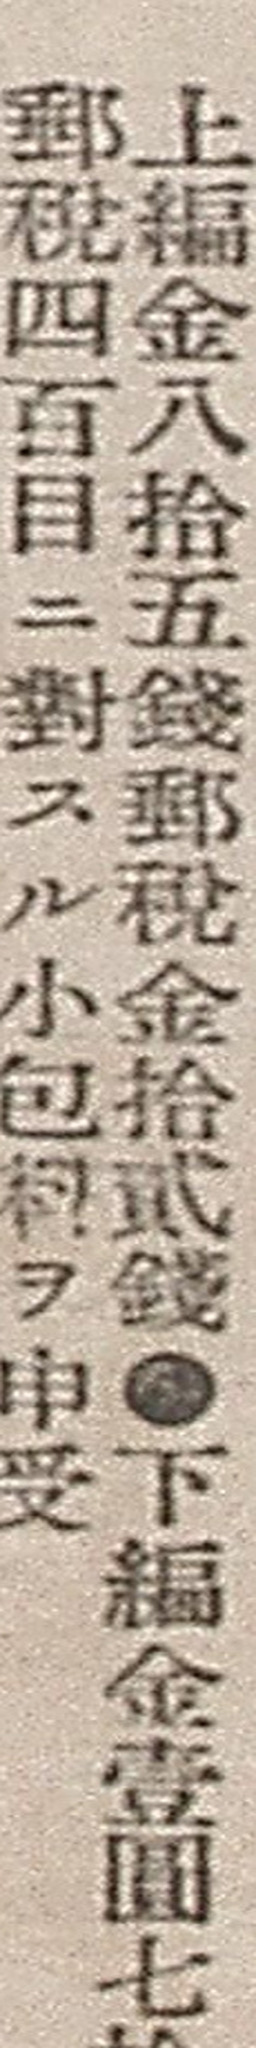郵税四百目二対スル小包料ヲ申受
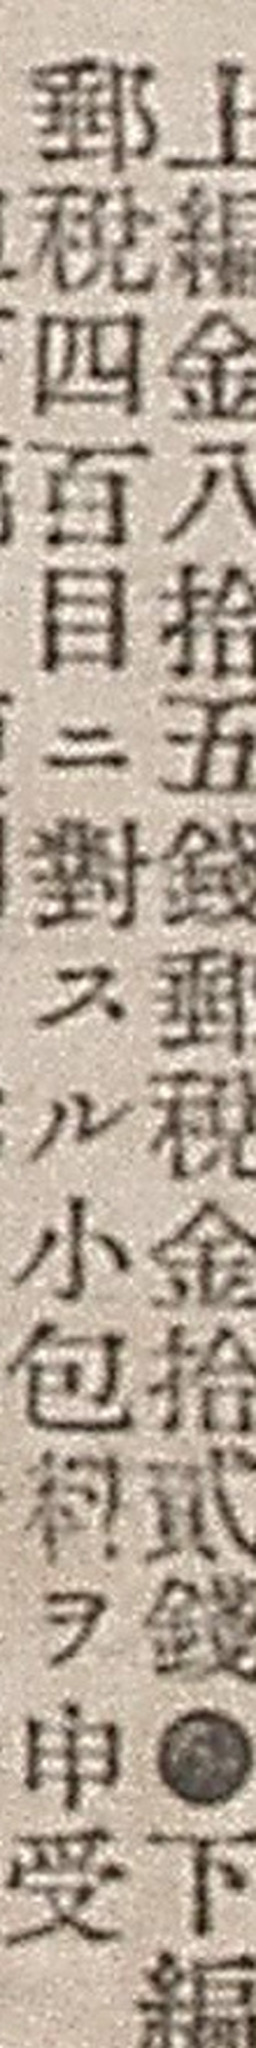郵税四百目二対スル小包料ヲ申受
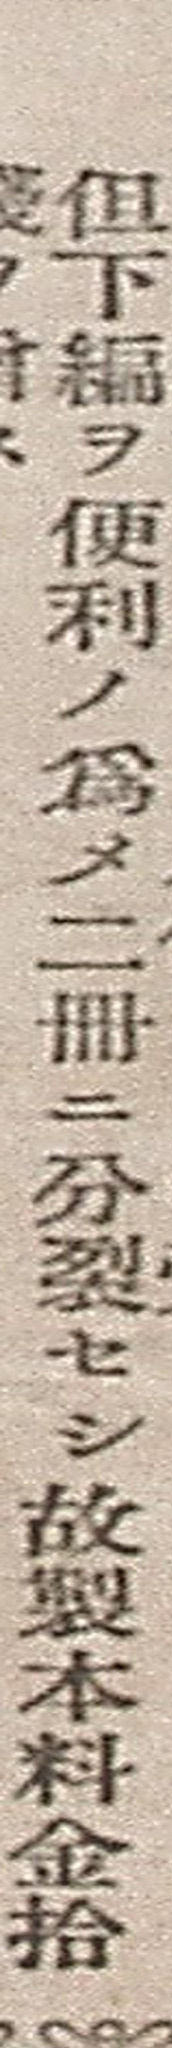但下編ヲ便利ノ為メ二冊二分裂セシ故製本料金拾
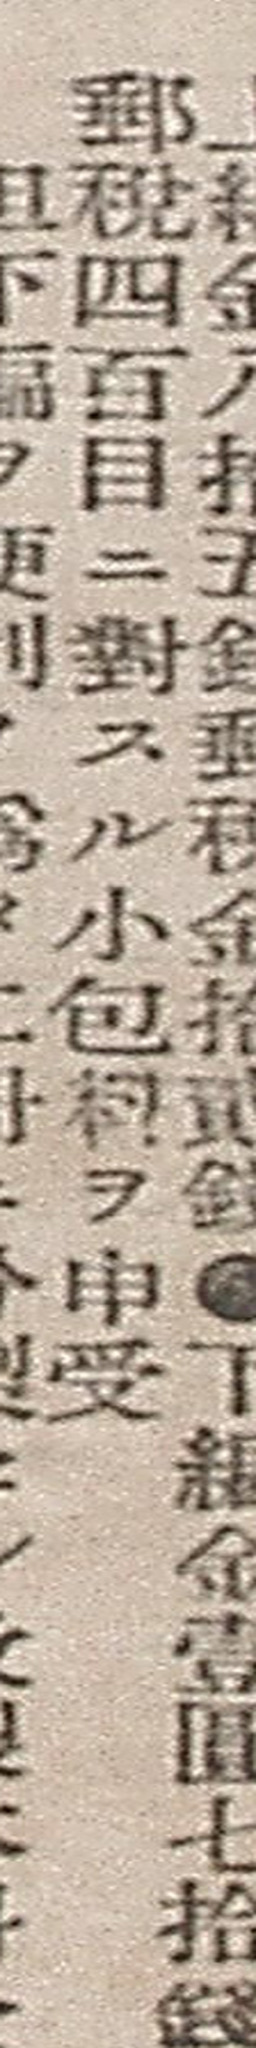郵税四百目二対スル小包料ヲ申受
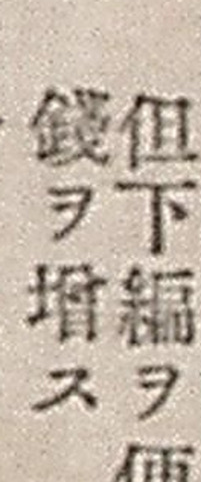銭ヲ増ス
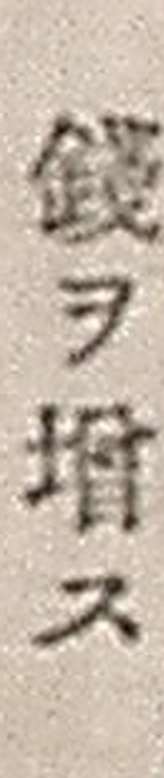銭ヲ増ス
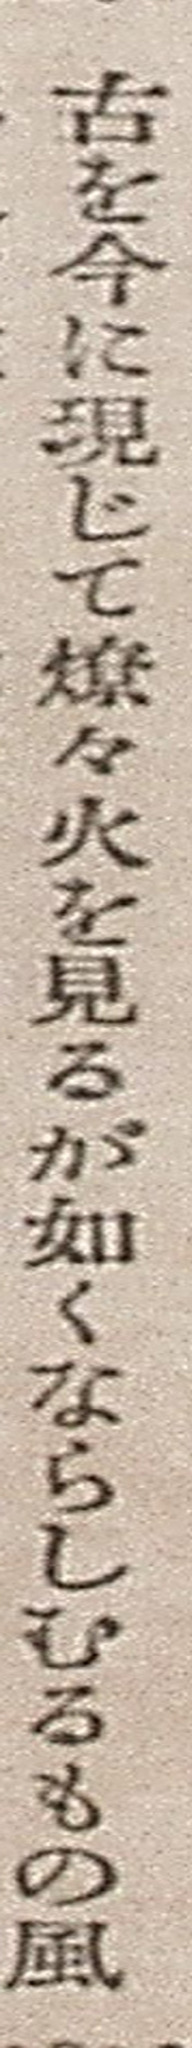古を今に現じて燎々火を見るが如くならしむるもの風
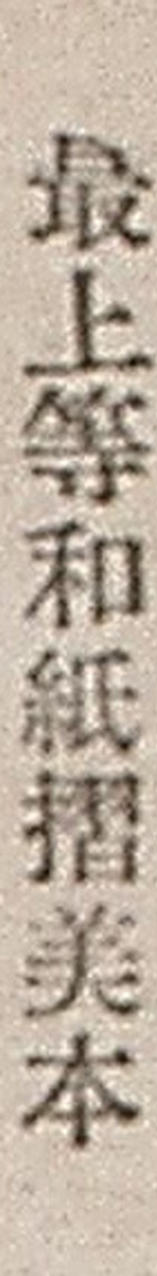最上等和紙摺美本
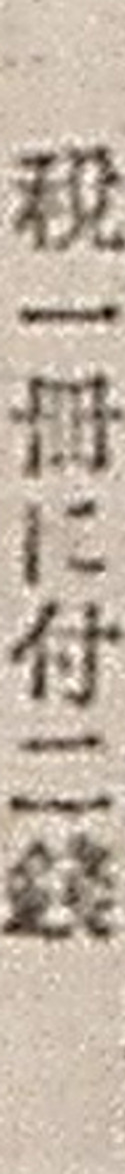税一冊に付二銭
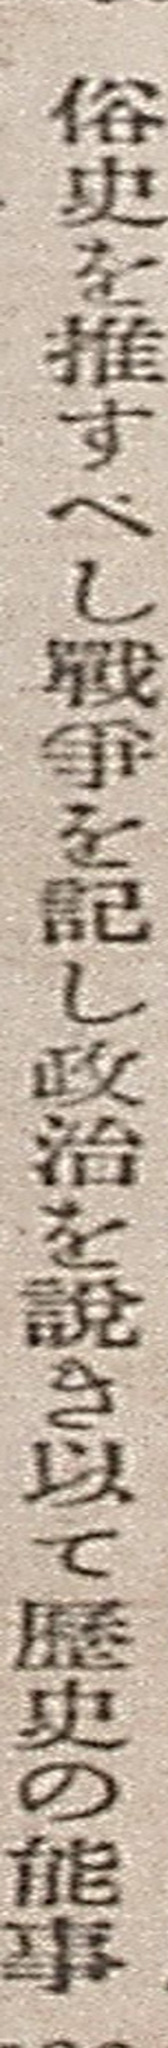俗史を推すべし戦争を記し政治を説き以て歴史の能事
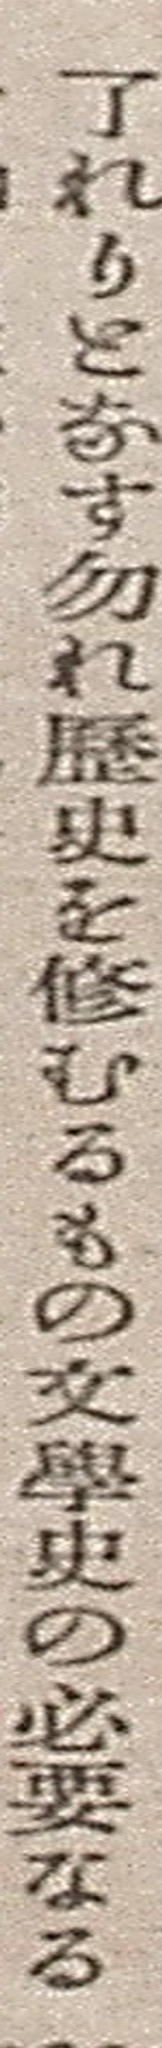了れりとなす勿れ歴史を修むるもの文学史の必要なる
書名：風俗畫報臨時増刊第百二十四號　洪水地震被害録（上）
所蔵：東京大学地震研究所図書室 Earthquake Research Institute Library, The University of Tokyo, JAPAN
